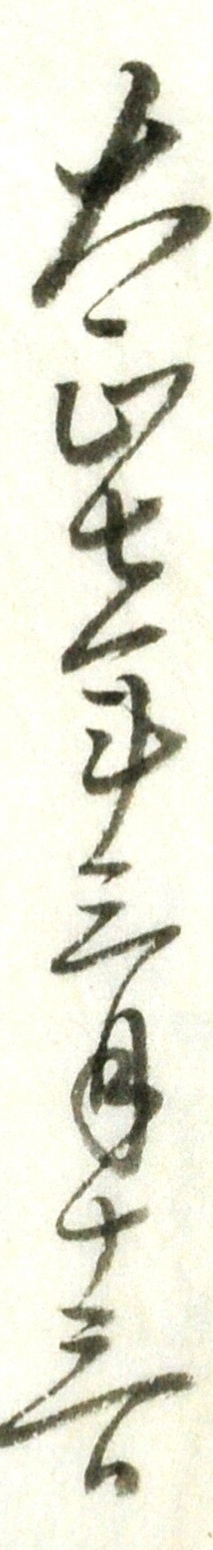大正七年三月十三日
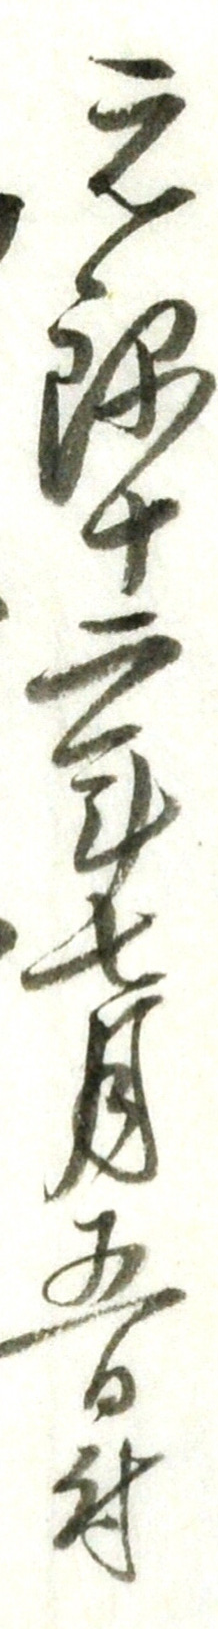元禄十二年七月五日付
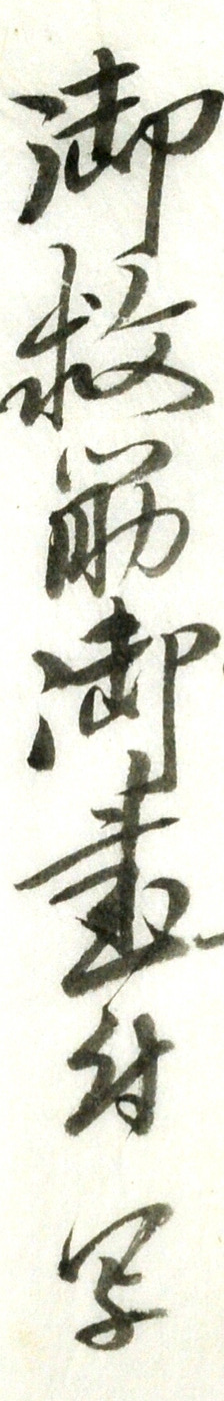御救筋御書付写
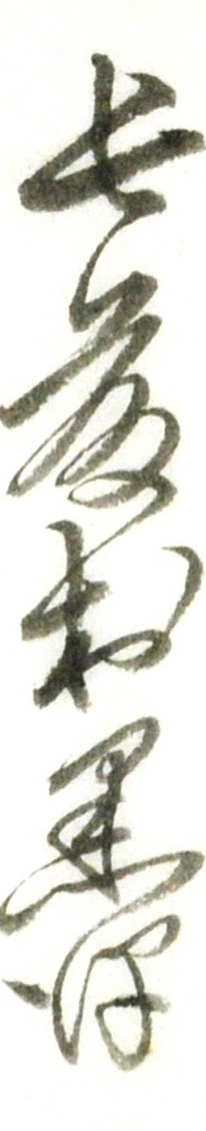長藤村黒沢
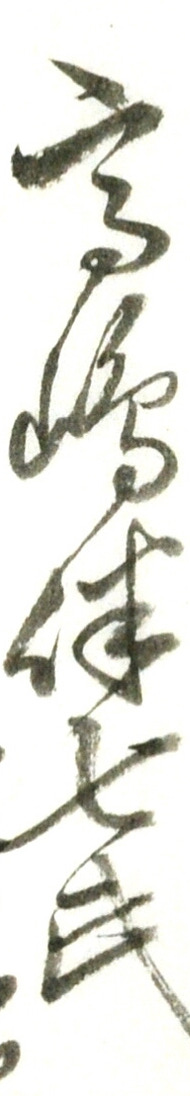高嶋伴七氏

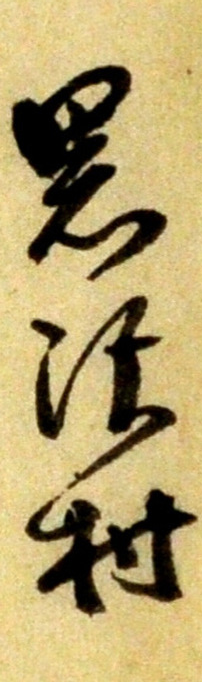黒沢村
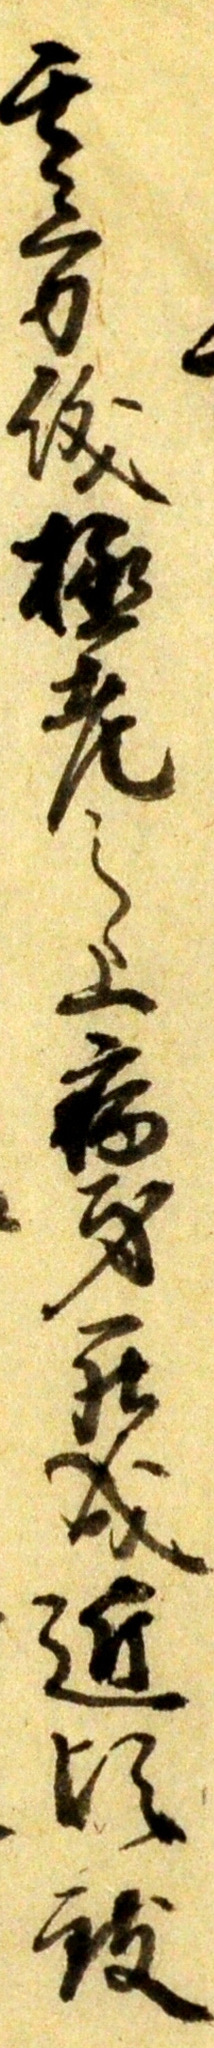其方儀極老之上病身罷成近頃致
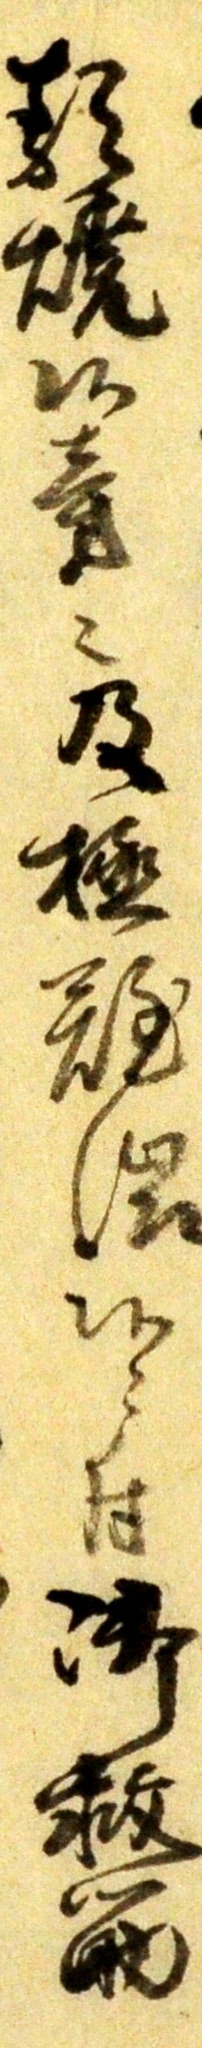類焼候旁ニ及極難渋候ニ付御救筋
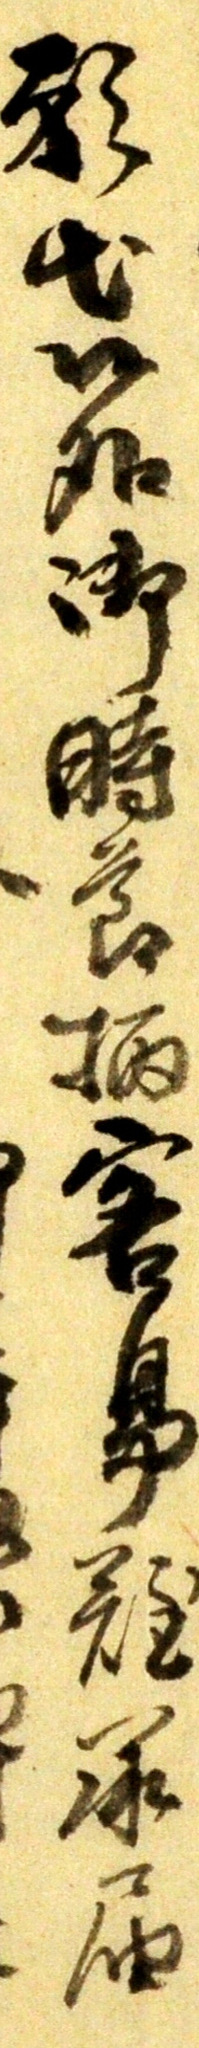願出候処御時節柄容易難承届
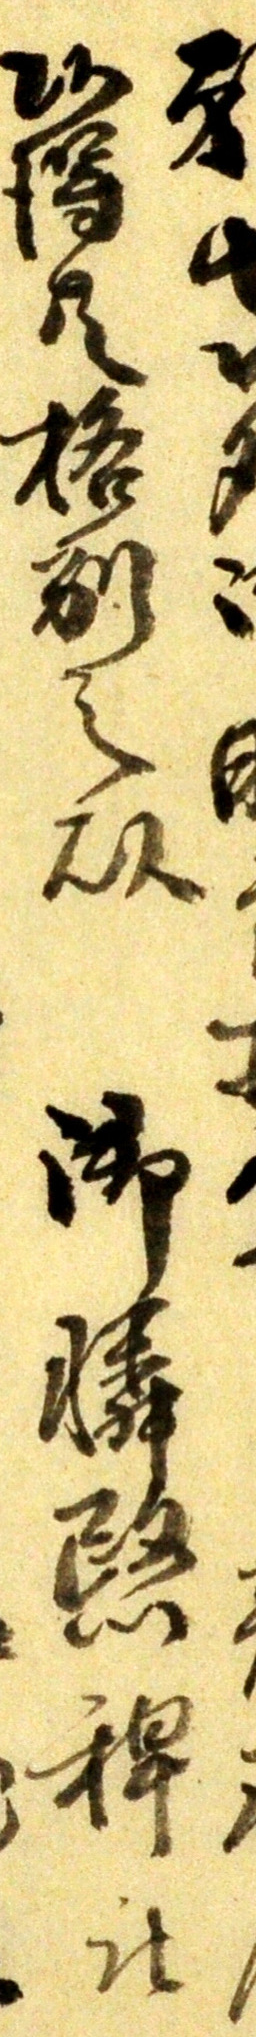候得共格別之以御憐愍稗被
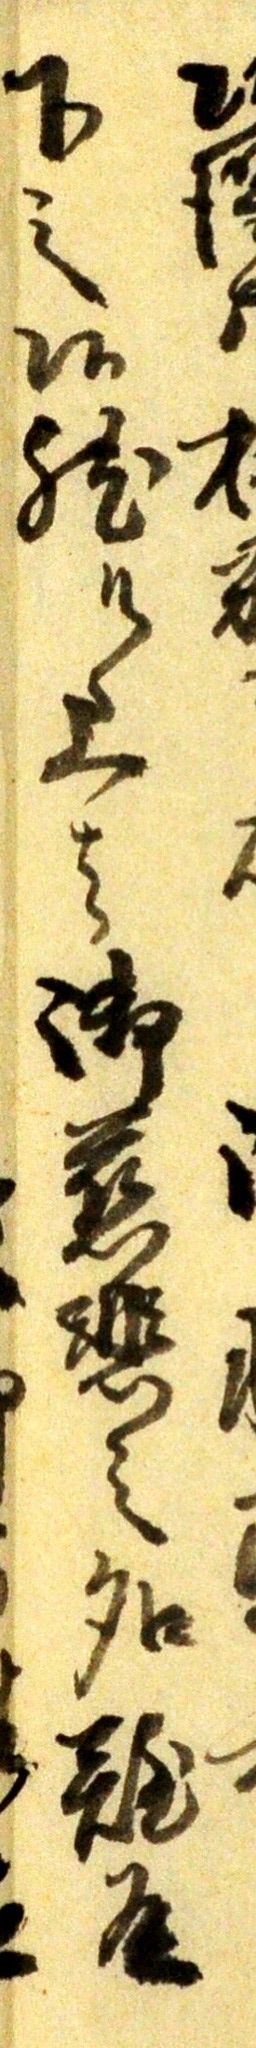下之候然ル上者御慈悲之処難有
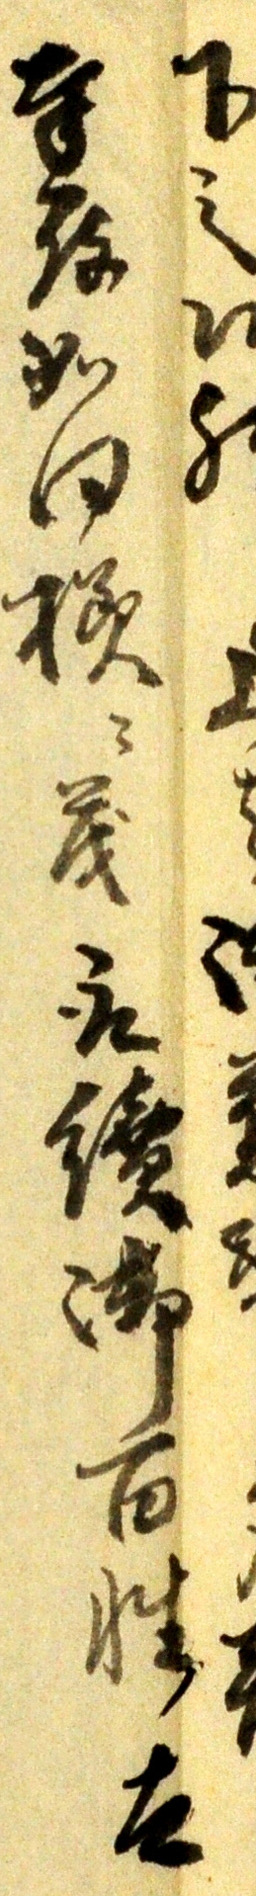奉存如同様ニ茂取続御百姓太
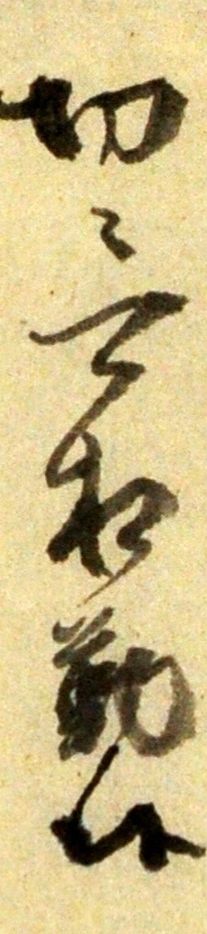切ニ可勤候
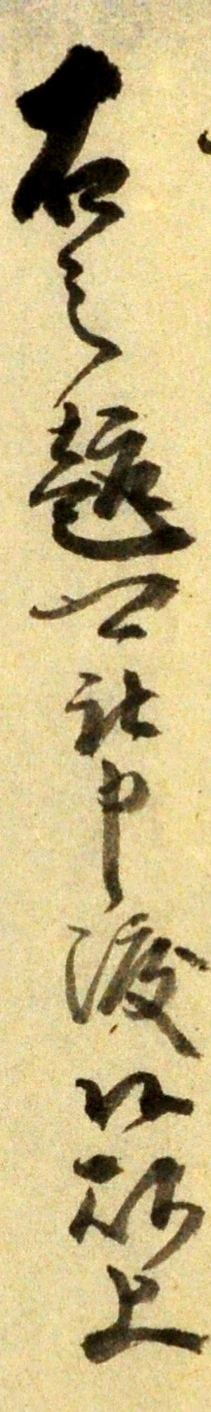右之趣可被申渡候以上
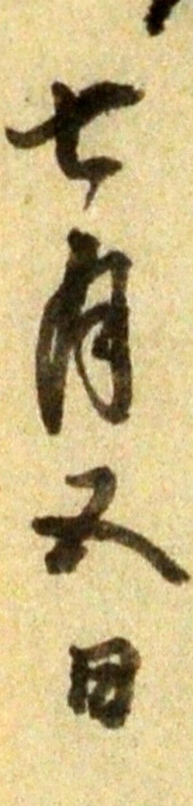七月五日
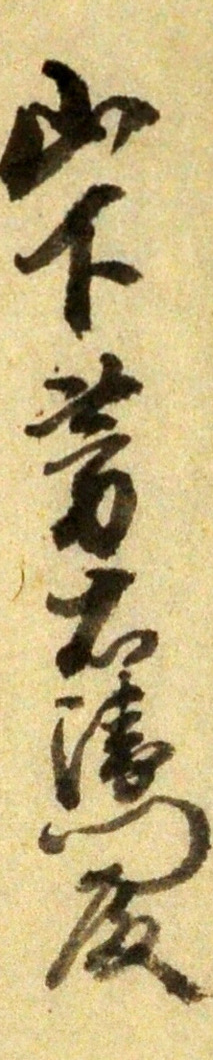山下房衛門殿
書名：御救筋御書付
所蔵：伊那市立高遠町図書館・合同会社AMANE
